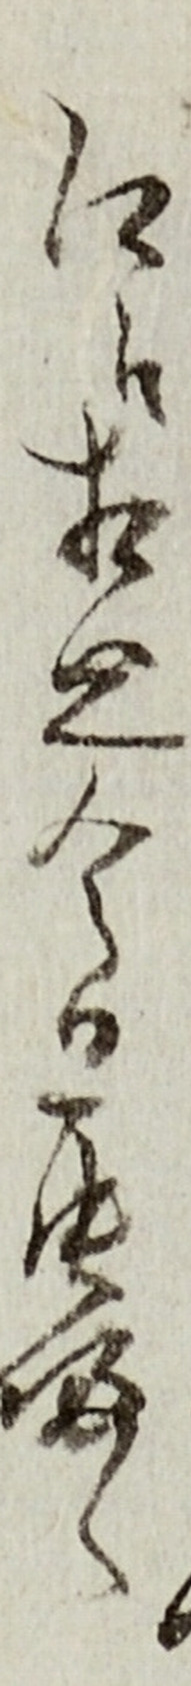郷江相廻今日罷帰候
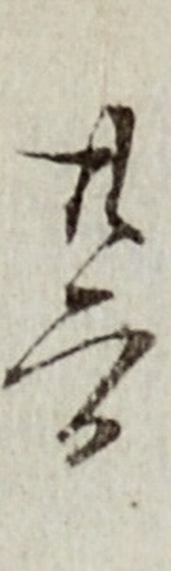廿二日
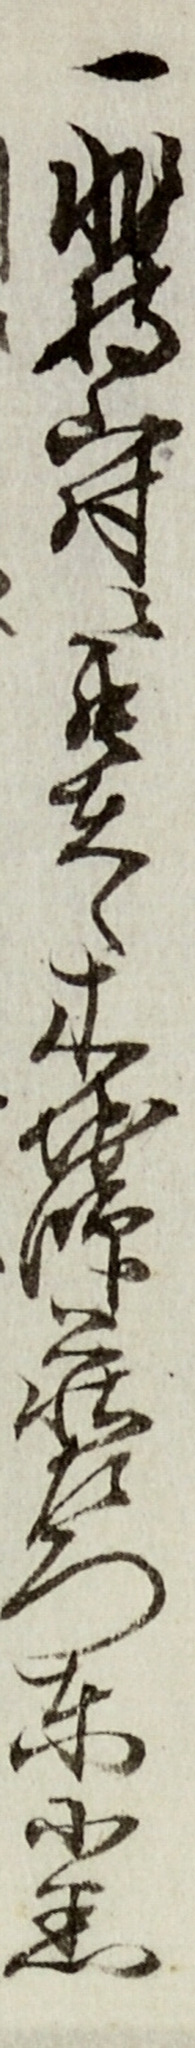一非持山村ニ罷在候木地師荘左衛門東小黒
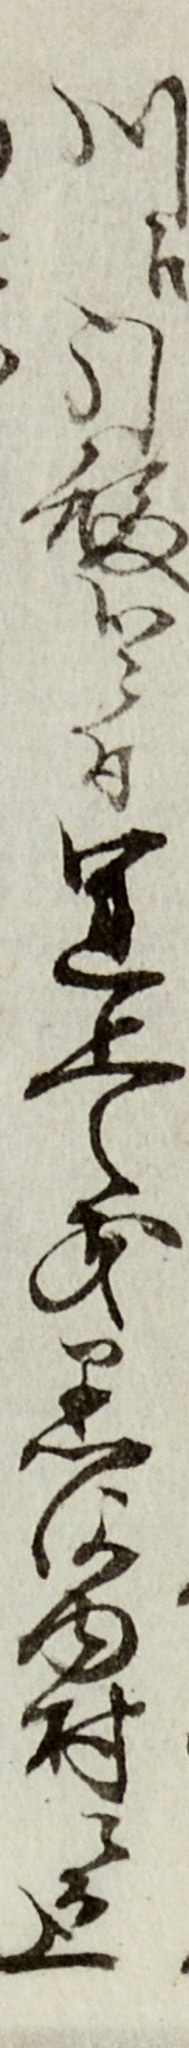川江引移候ニ付運上之義黒河内村ニ而上
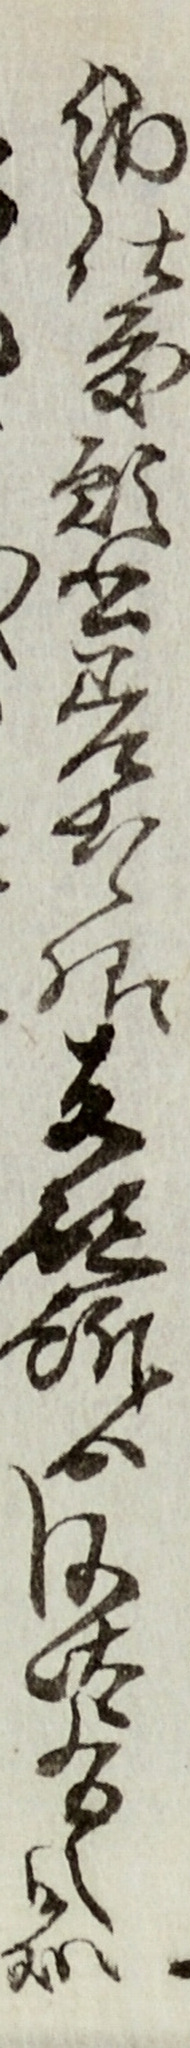納仕度願書差出候様支配所ゟ沙汰有之候処
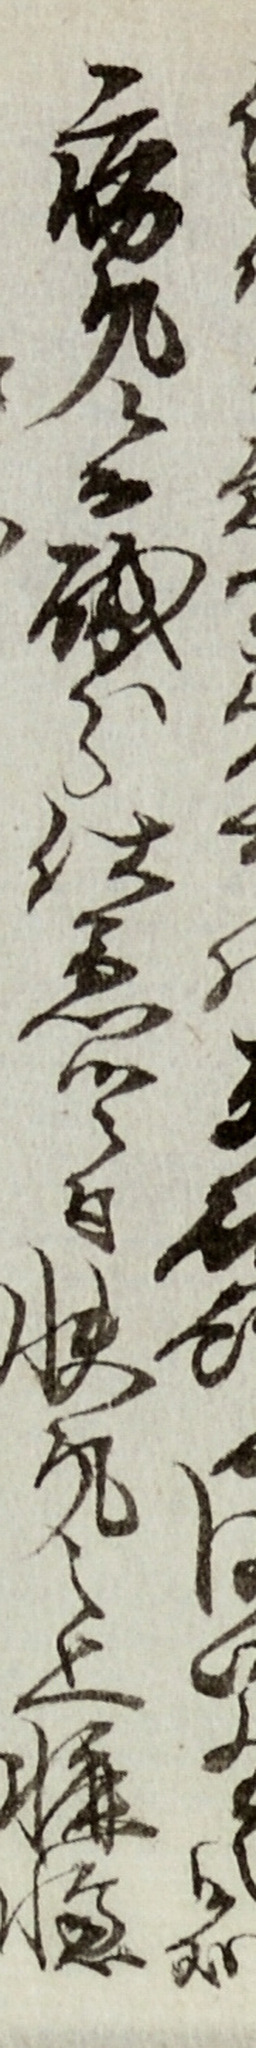病気ニ而職分仕兼候ニ付快気之上轆轤
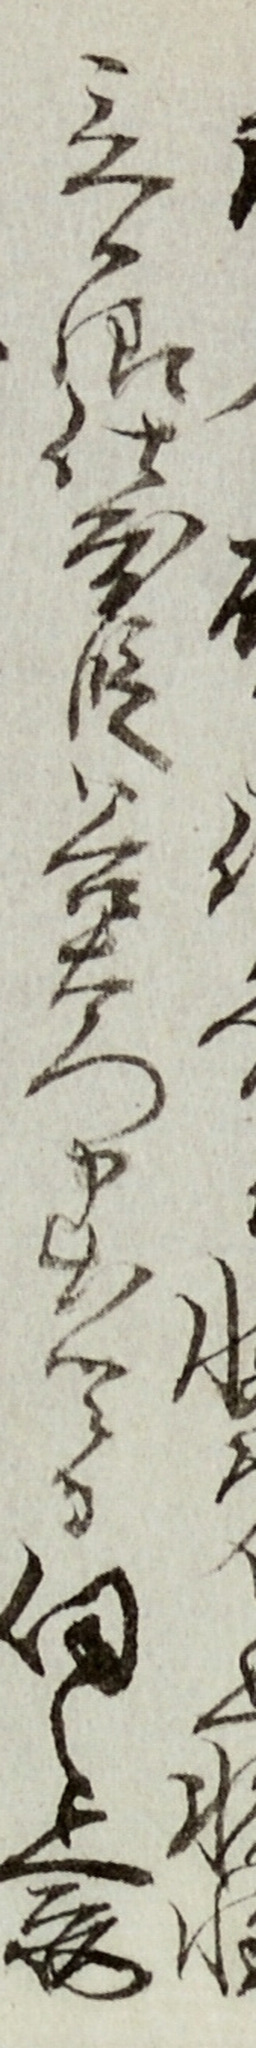立候様仕度段谷右衛門申出候ニ付伺之上病
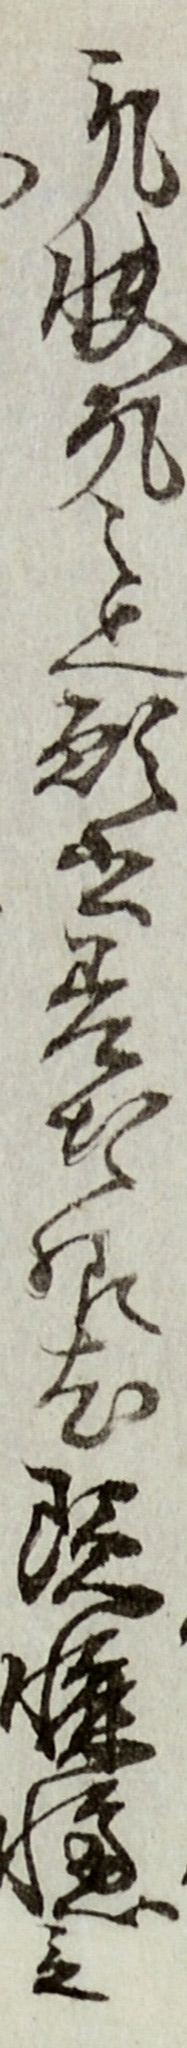気快気之上願書差出候様尤隠轆轤立
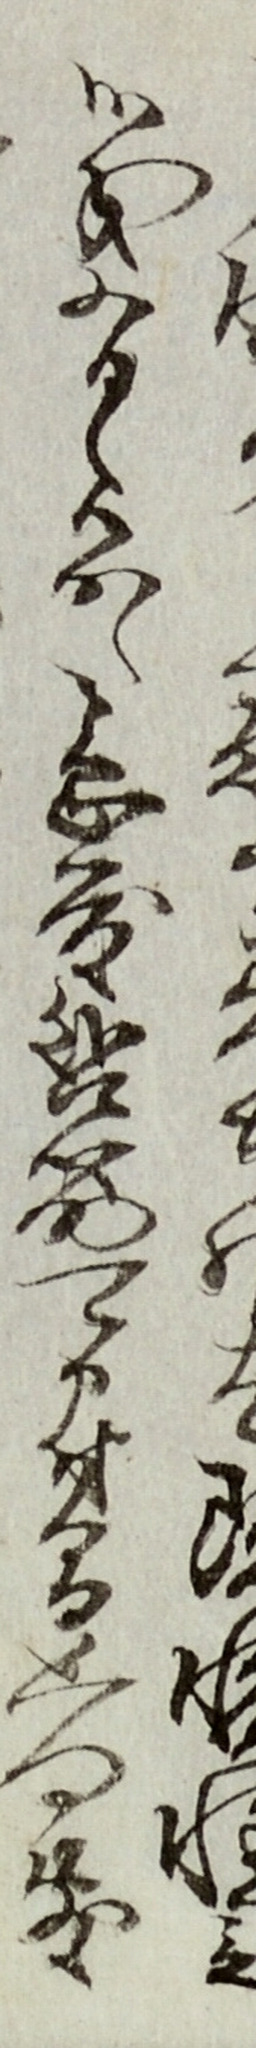候義有之候ハヽ急度咎筋可申付間如何敷
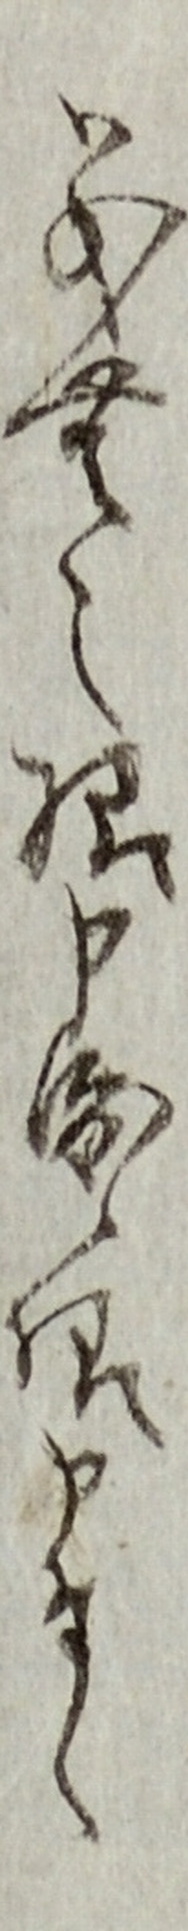義無之様申渡候様申付候

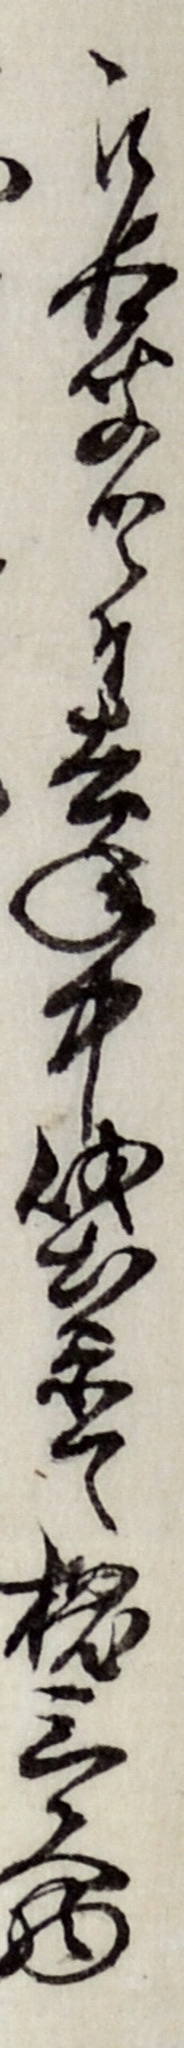被仰聞候ニ付去年中伐出置候榥三尺物
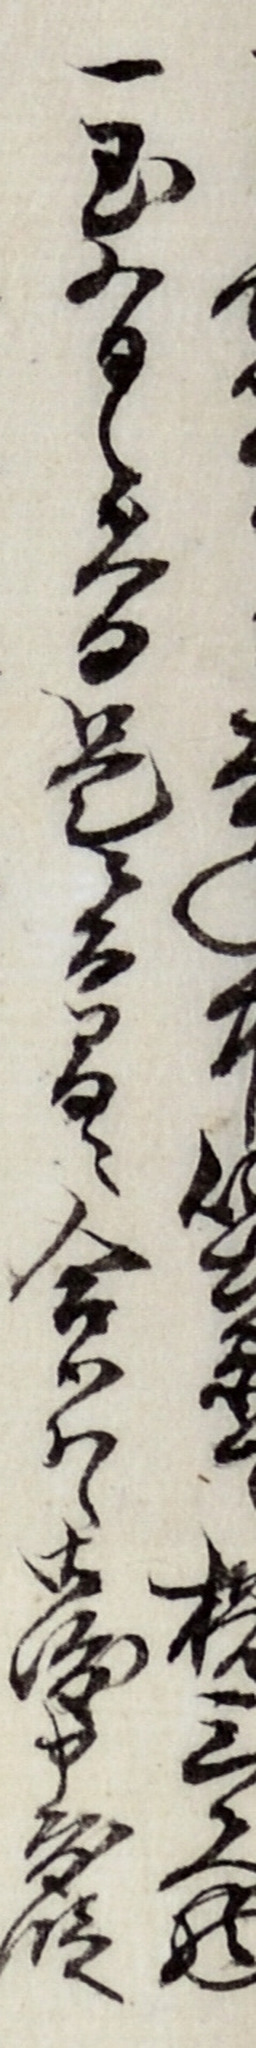一玉有之候間是ニ而間ニ合候ハヽ御渡申度段
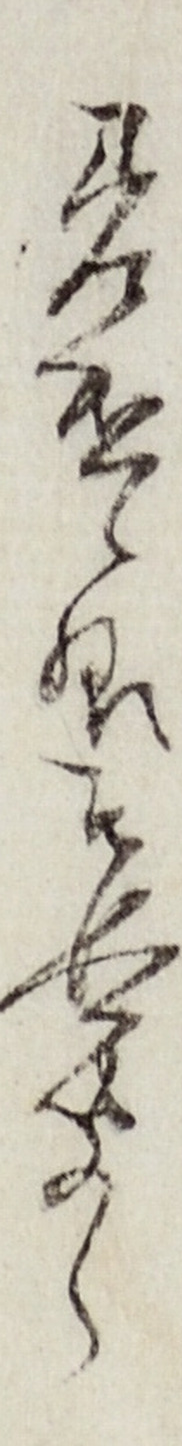差遣候様被仰聞候
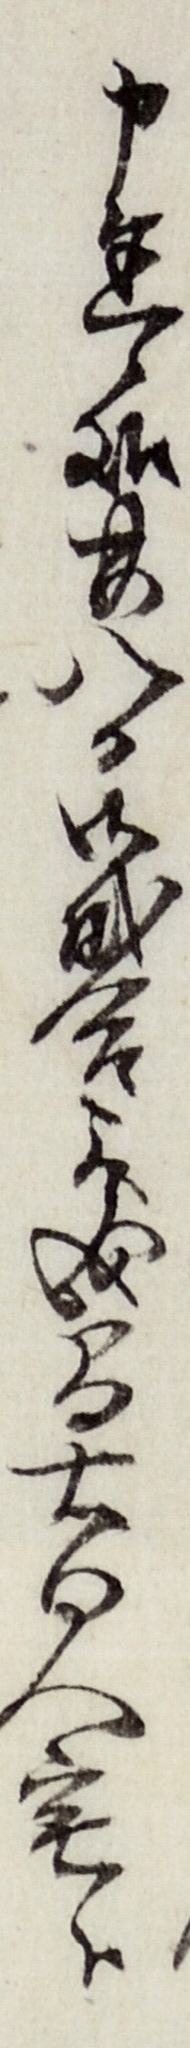申達候処廿八日御掛合被成間右同人宅江
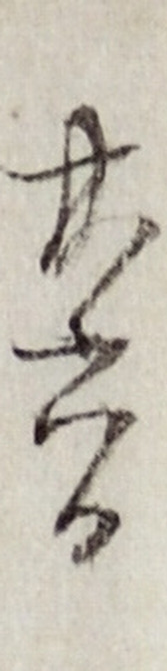廿六日
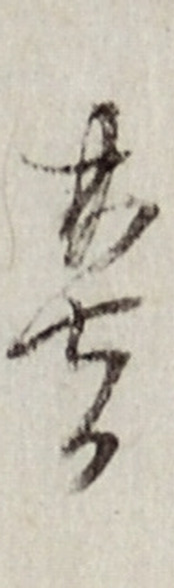廿七日
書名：御山方御薪方諸事御用留
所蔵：伊那市立高遠町図書館・合同会社AMANE
